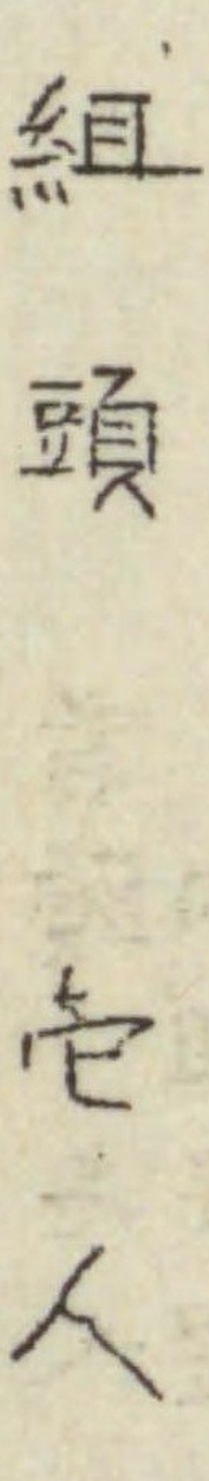組頭壱人
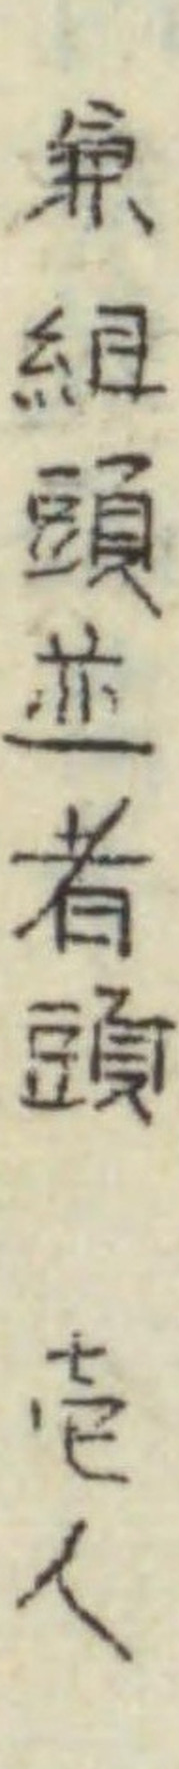兼組頭並者頭壱人
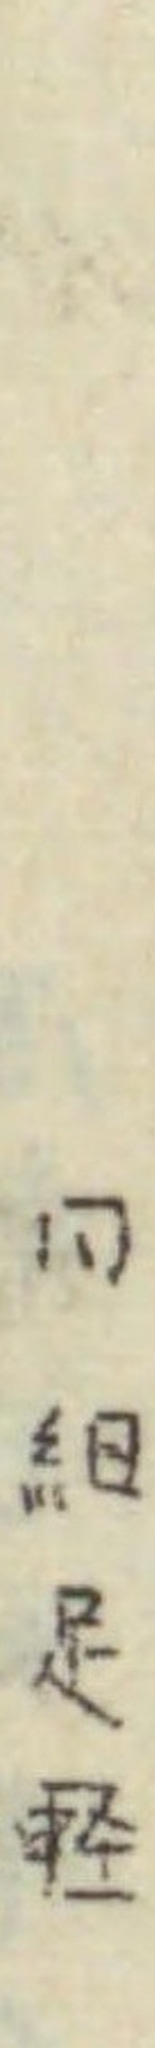同組足軽
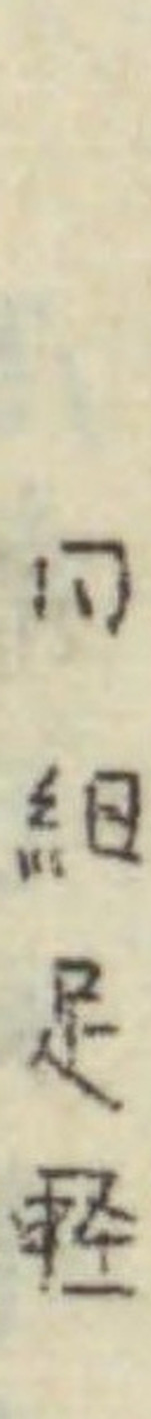同組足軽
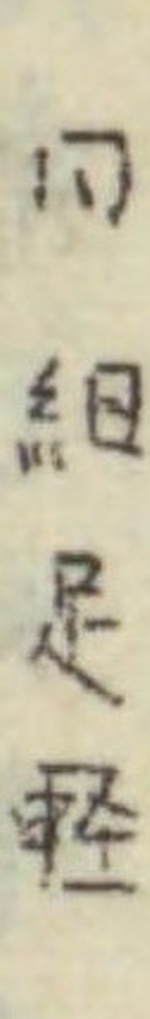同組足軽

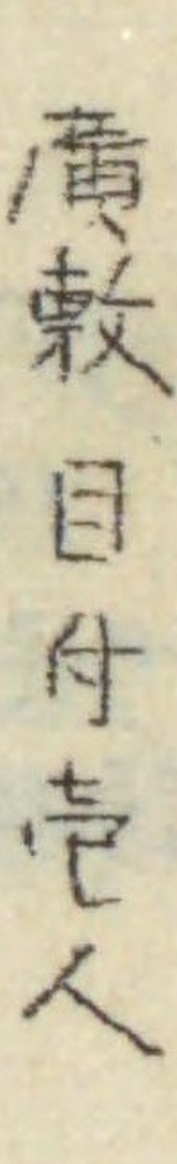広敷目付壱人
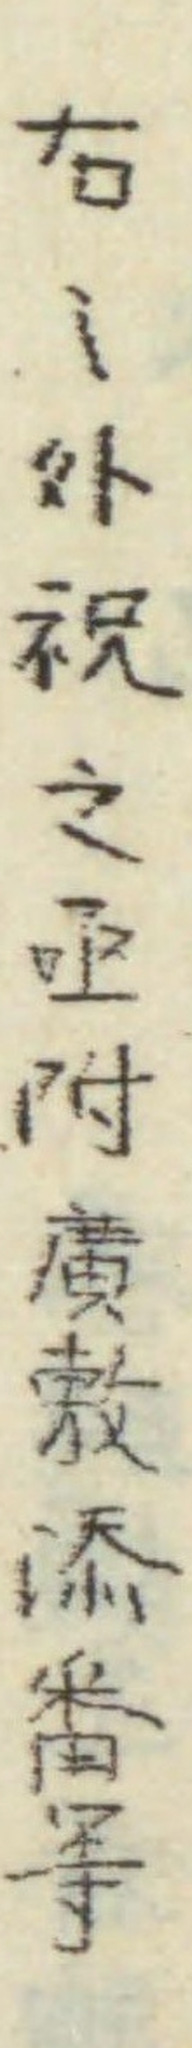右之外祝之函附広敷添番号
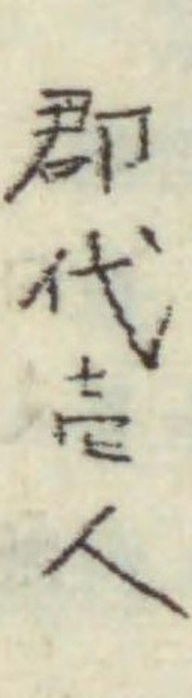郡代壱人
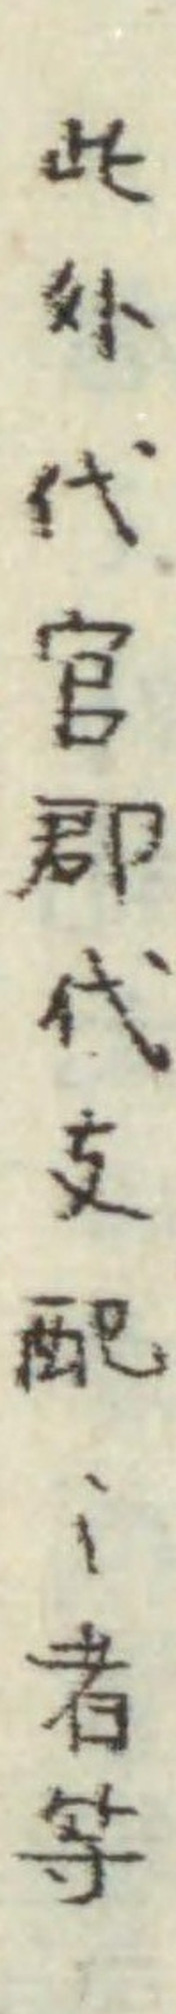此外代官郡代支配之者ら
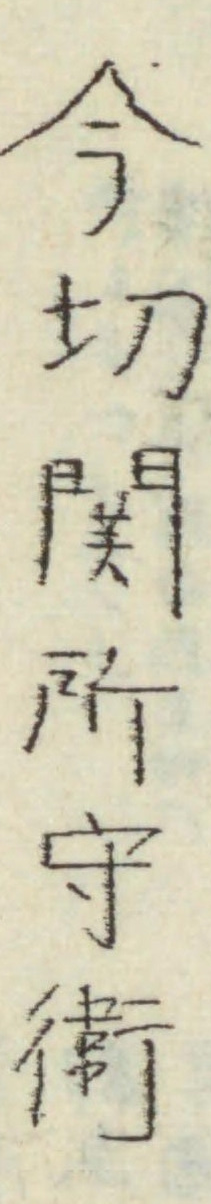今切関所守衛
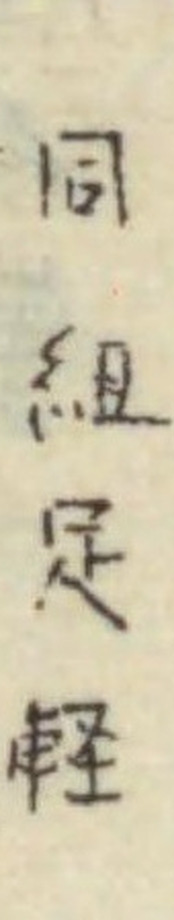弓同組足軽
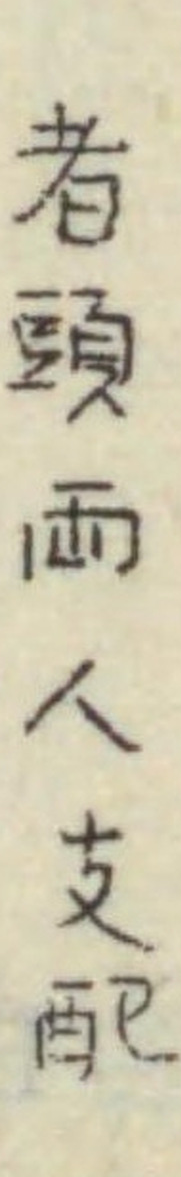者頭両人支配
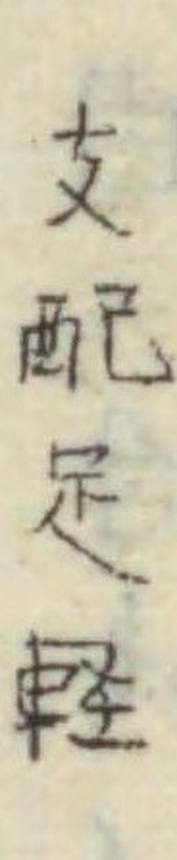支配足軽
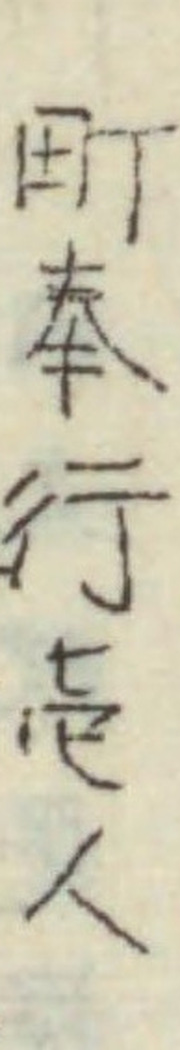町奉行壱人
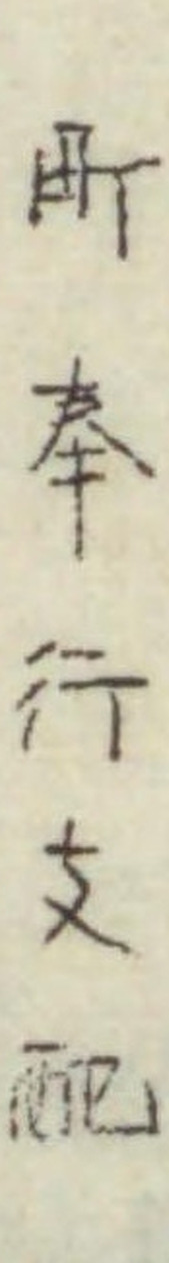町奉行支配
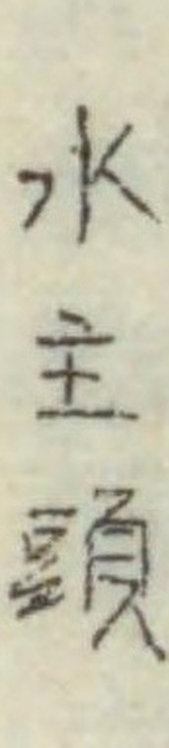水主頭
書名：三河吉田藩動員史料
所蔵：国立国会図書館 National Diet Library, JAPAN
